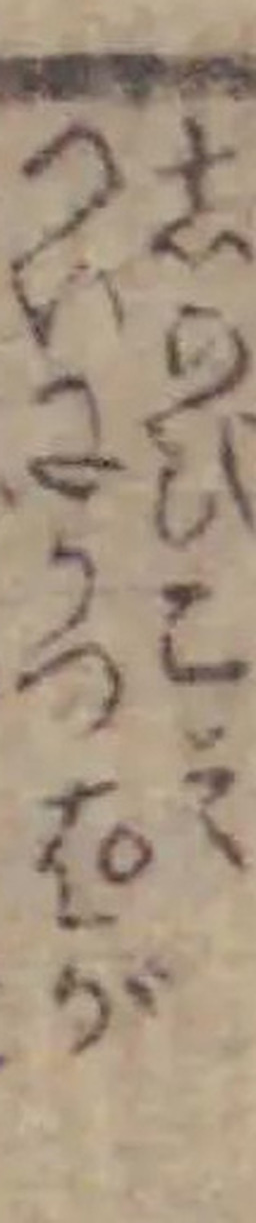ついにかつぱが
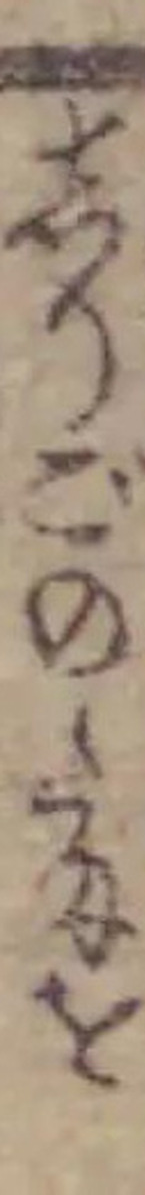しりごのたまを
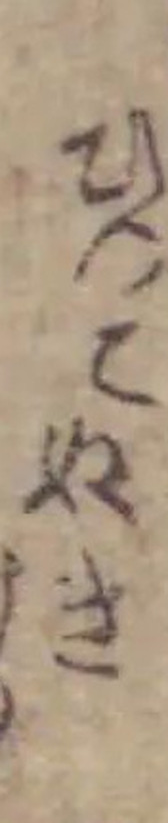ひつこぬき

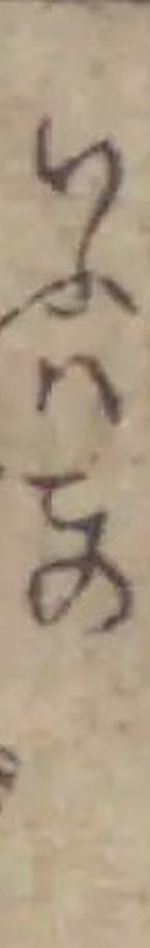いふはこの
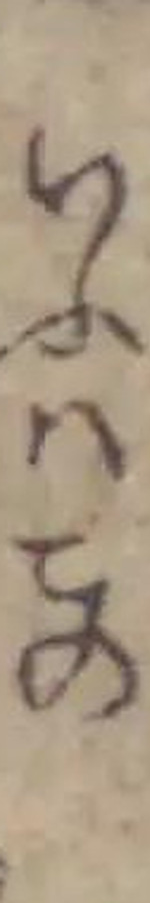いふはこの
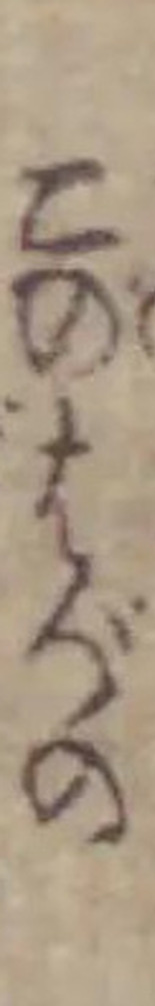このはづの
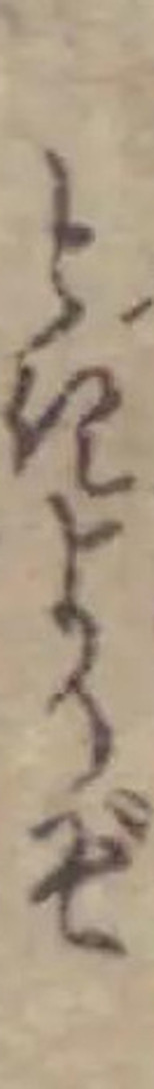ときよりぞ
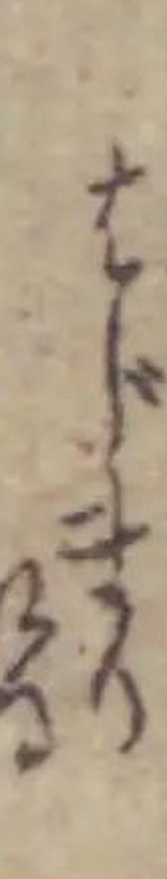はじまり
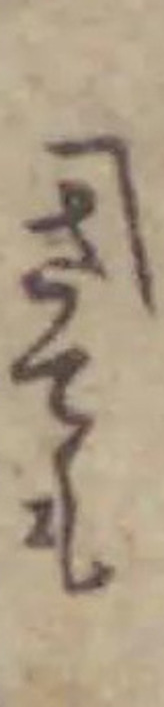〽さても
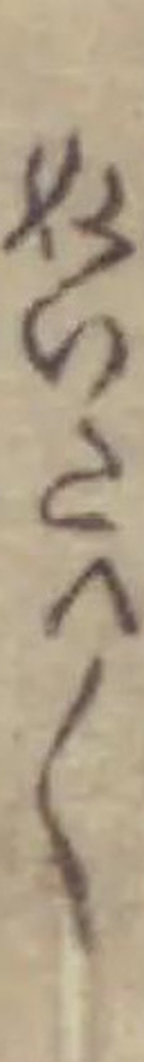ぬいたは〳〵
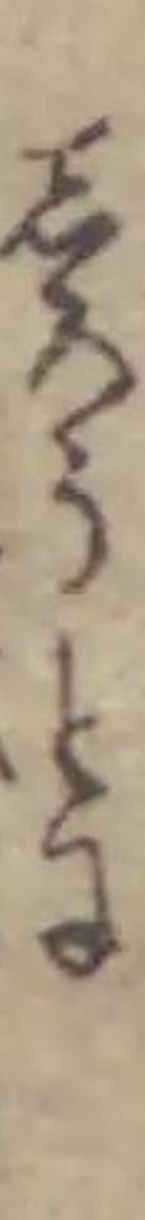しろうとに
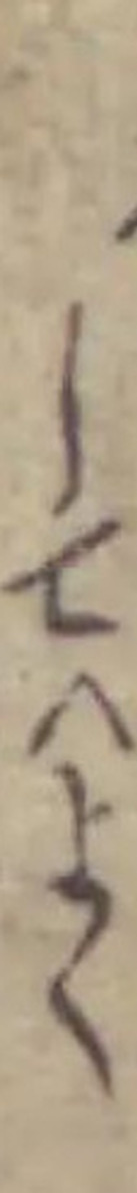してはよく
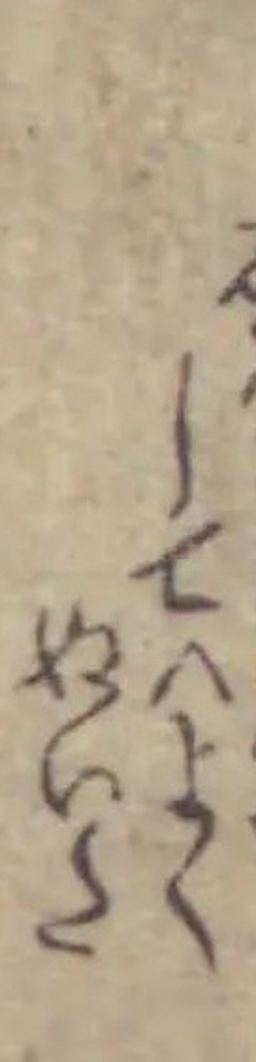ぬいた
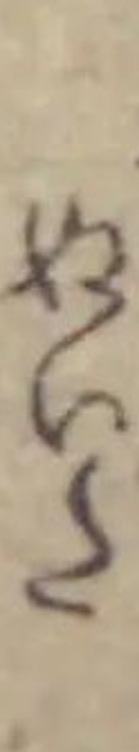ぬいた
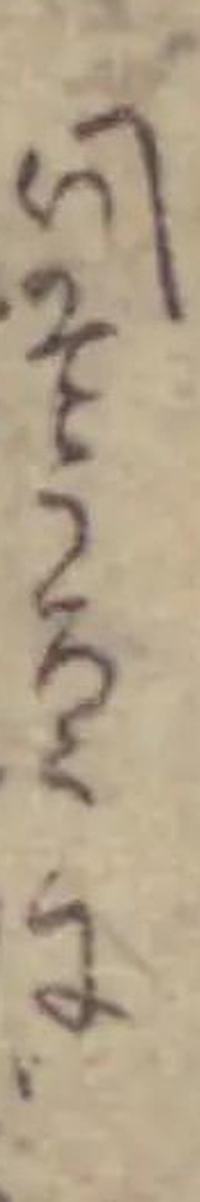〽いそうろうに
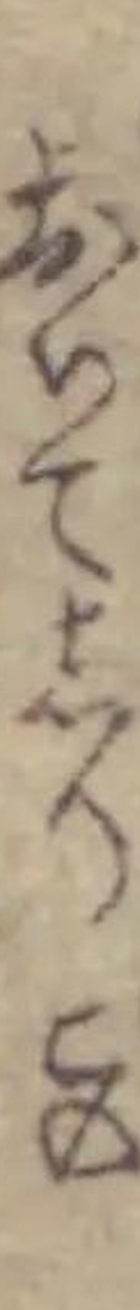おいてしりごの
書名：化物太平記 3巻
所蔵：国立国会図書館 National Diet Library, JAPAN
